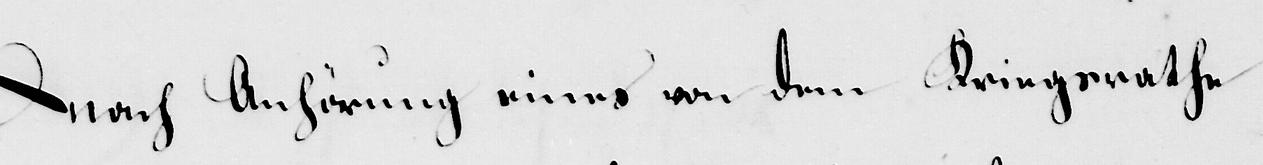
Nach Anhörung eines von dem Kriegsrathe
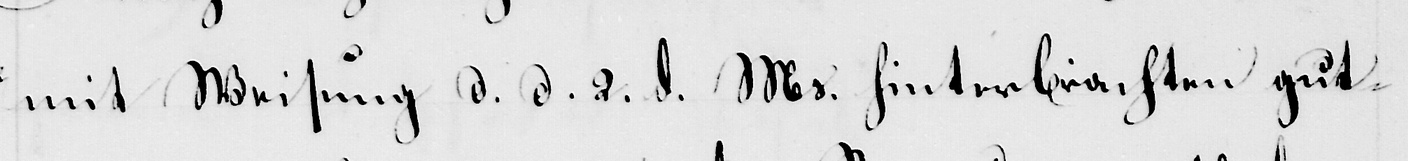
mit Weisung d. d. 2. d. Ms. hinterbrachten gut¬
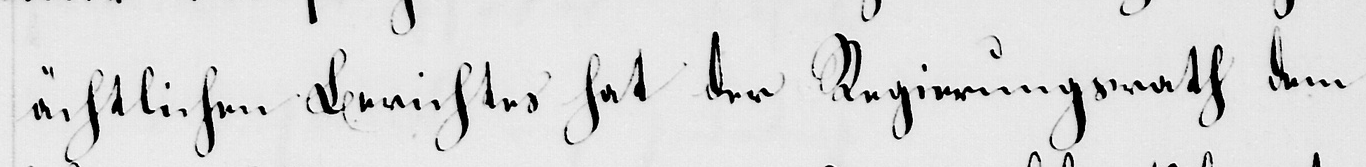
ächtlichen Berichtes hat der Regierungsrath dem
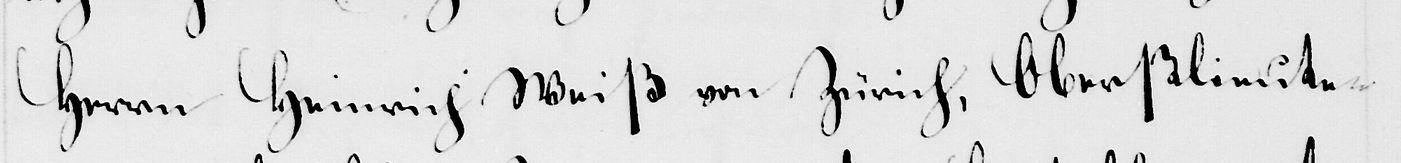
Herrn Heinrich Weiß von Zürich, Oberstlieute¬
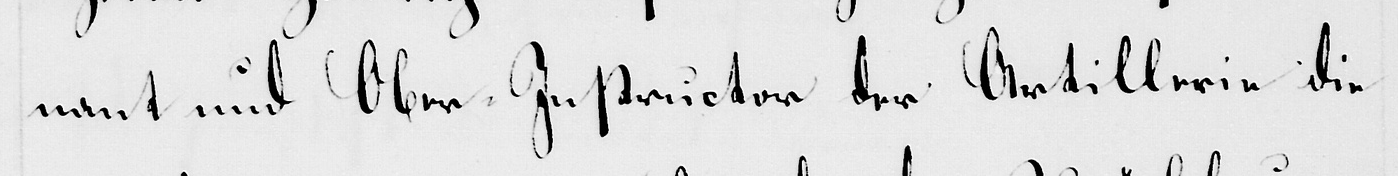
nant und Ober-Instructor der Artillerie die
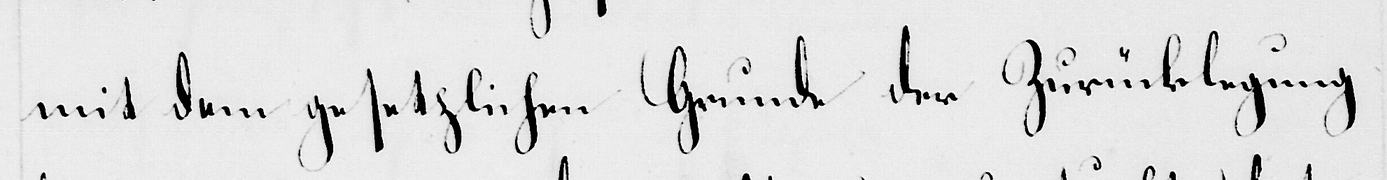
mit dem gesetzlichen Grunde der Zurücklegung
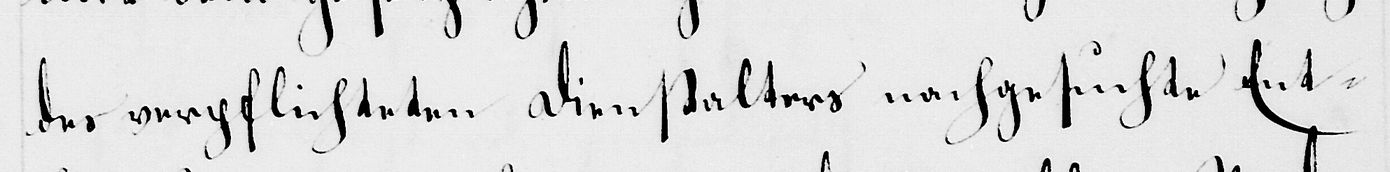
des verpflichteten Dienstalters nachgesuchte Ent¬
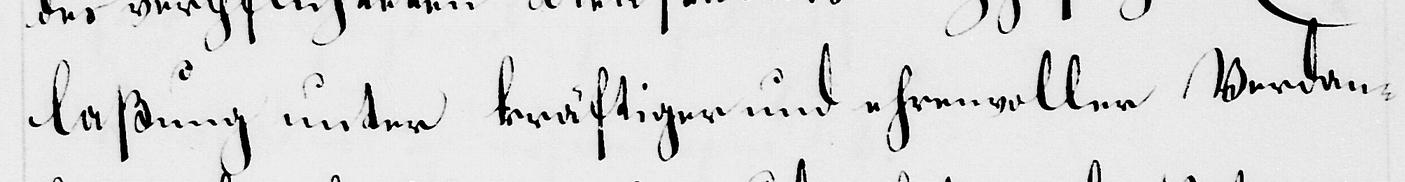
laßung unter kräftiger und ehrenvollen Verdan¬
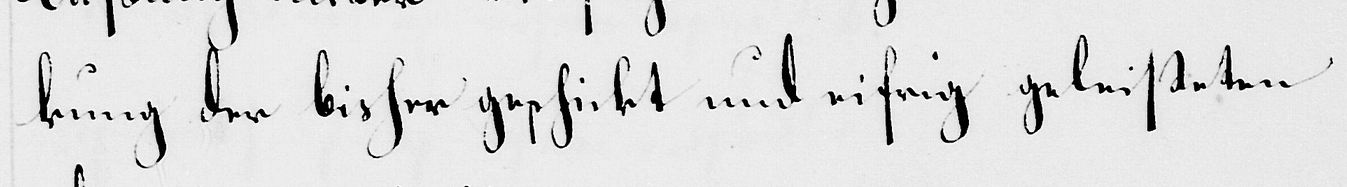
kung der bisher geschickt und eifrig geleisteten
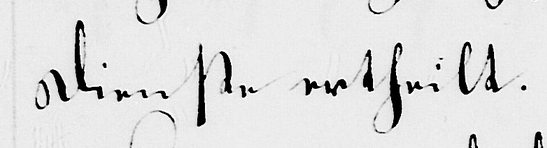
Dienste ertheilt.
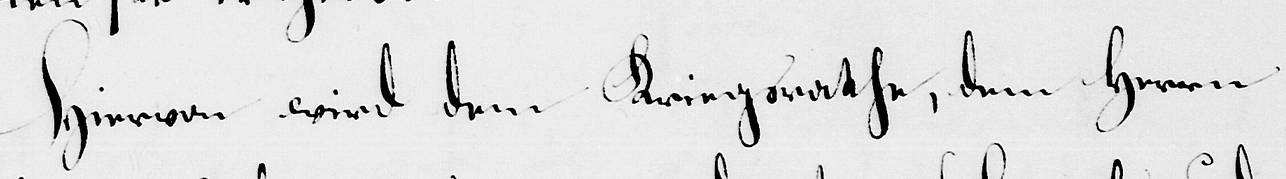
Hiervon wird dem Kriegsrathe, dem Herrn
